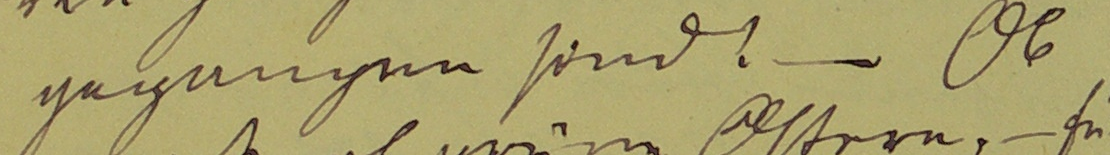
gegangen sind.!—Ob
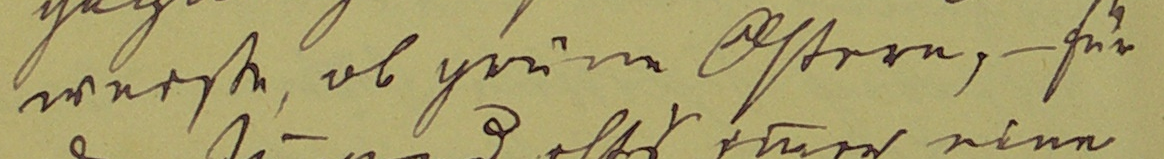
weiße oder grüne Ostern,- für
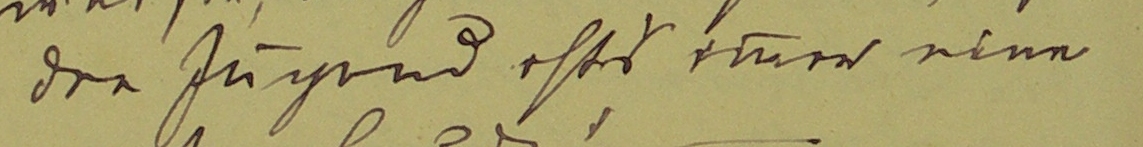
die Jugend ist es immer eine
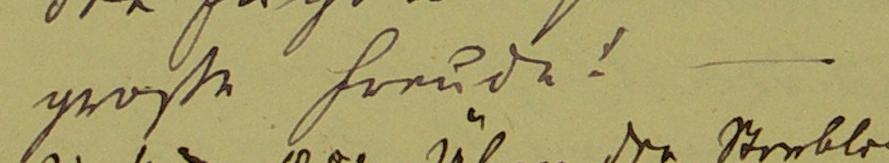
große Freude !—
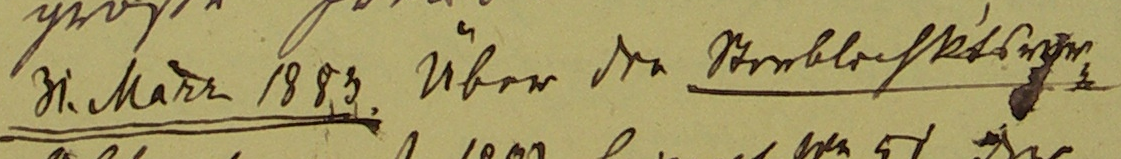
31. März 1883. Über die Sterblichkeitsver¬
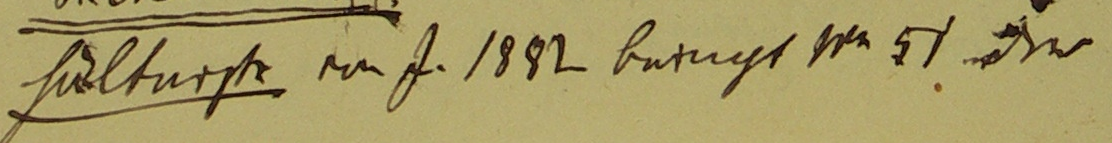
hältniße im J. 1882 bringt Nr. 51 der
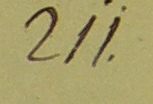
211
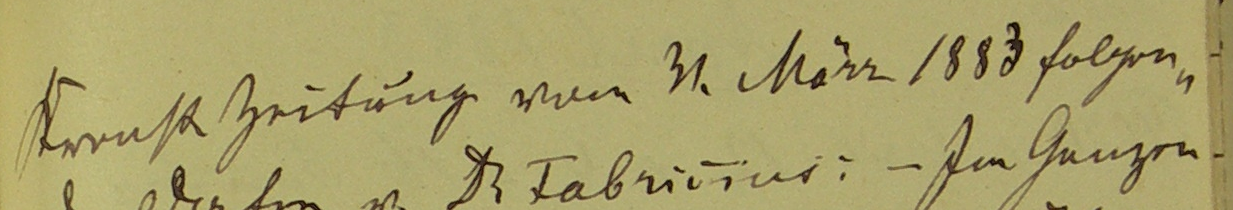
Kronstädter Zeitung vom 31. März 1883 folgen¬
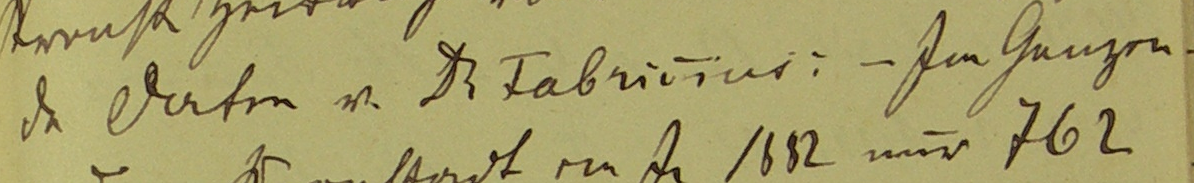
de Daten von Dr. Fabricius:--Im Ganzen
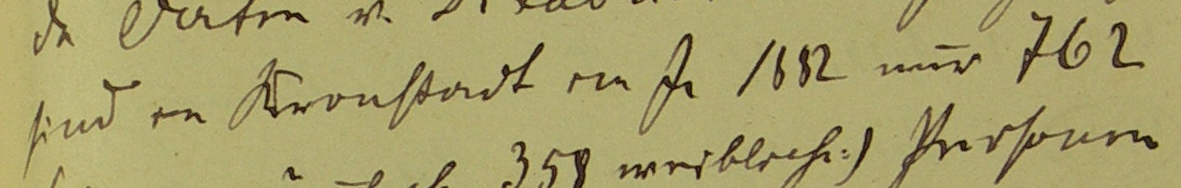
sind in Kronstadt im Jahre 1882 nur 762
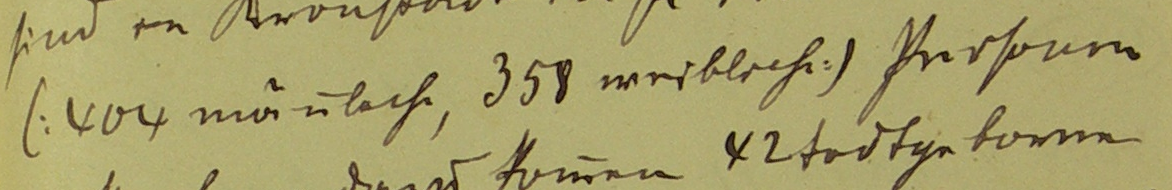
Personen ( : 404 männlich und 351 weiblich . )
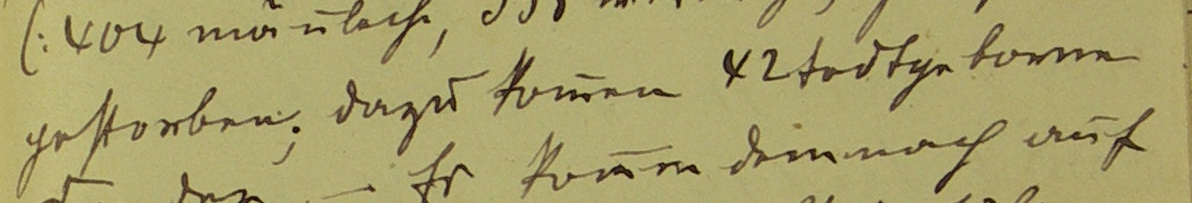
gestorben. Dazu kommen 42 todtgeborene
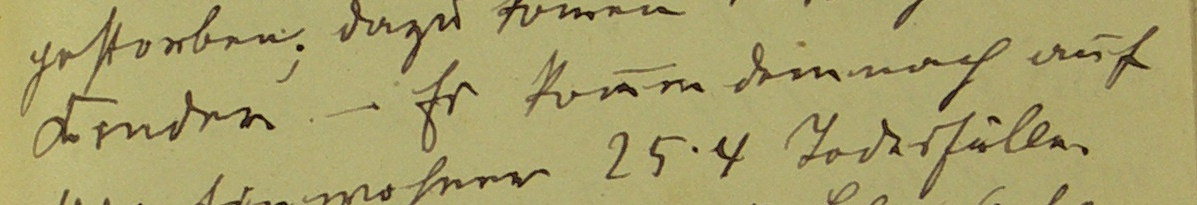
Kinder.--. Er kommen demnach auf
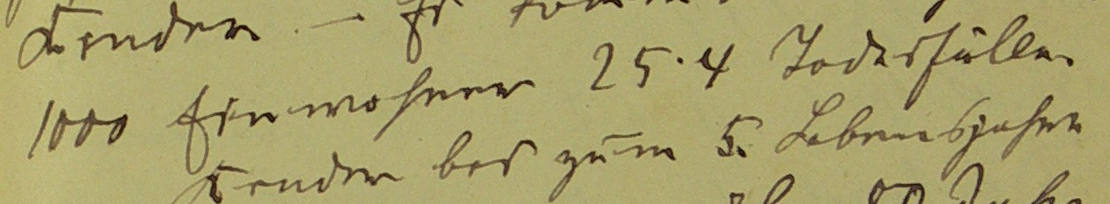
1000 Einwohner 25.4 Todesfälle.
